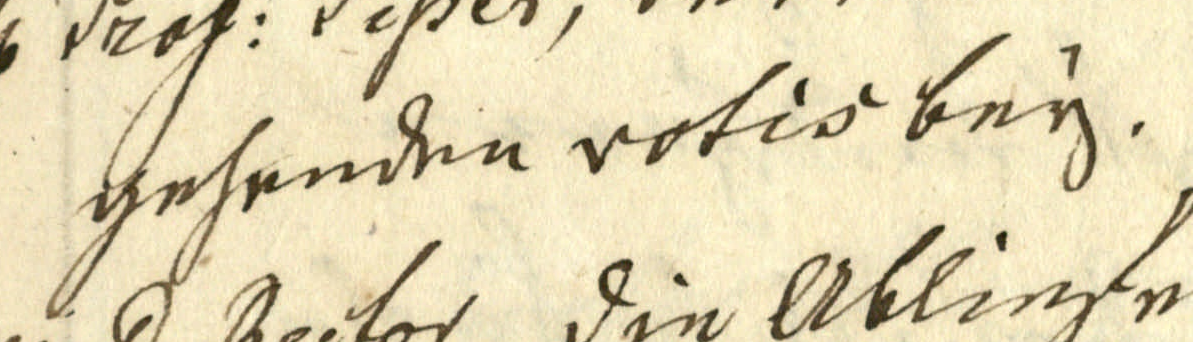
gehenden votis beÿ.
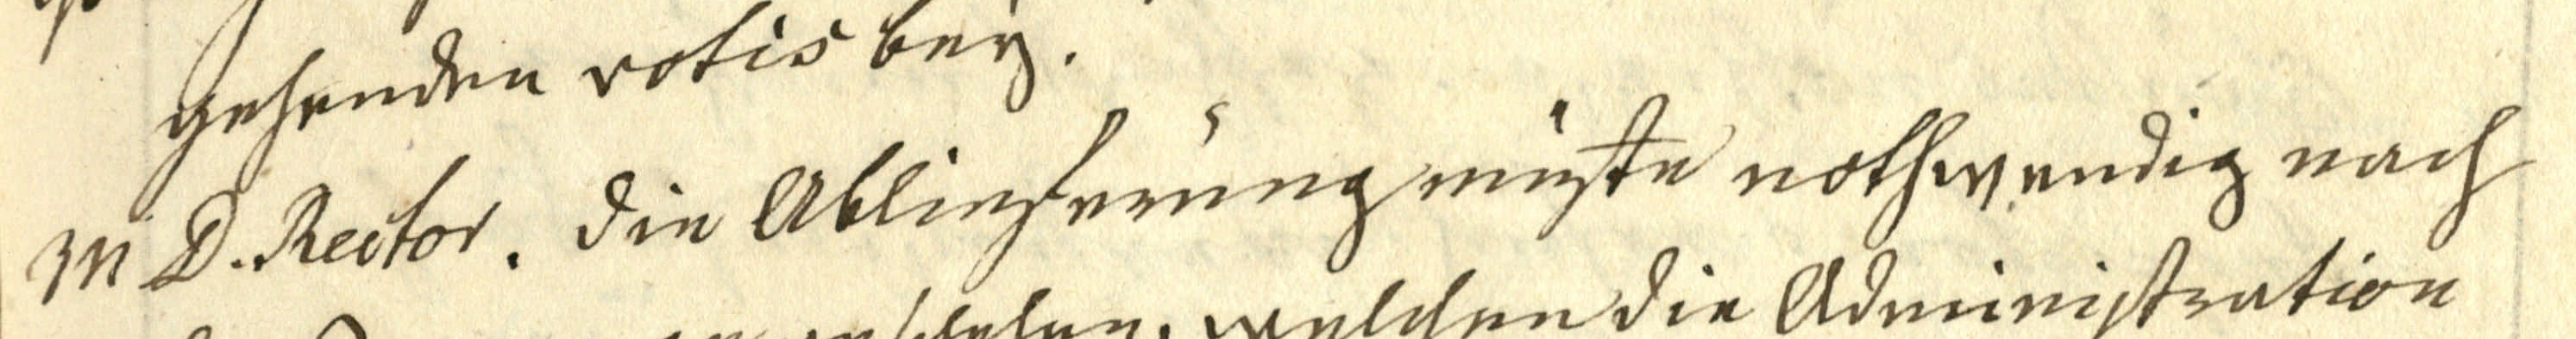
M. D. Rector. die Ablieferung müste nothwendig nach
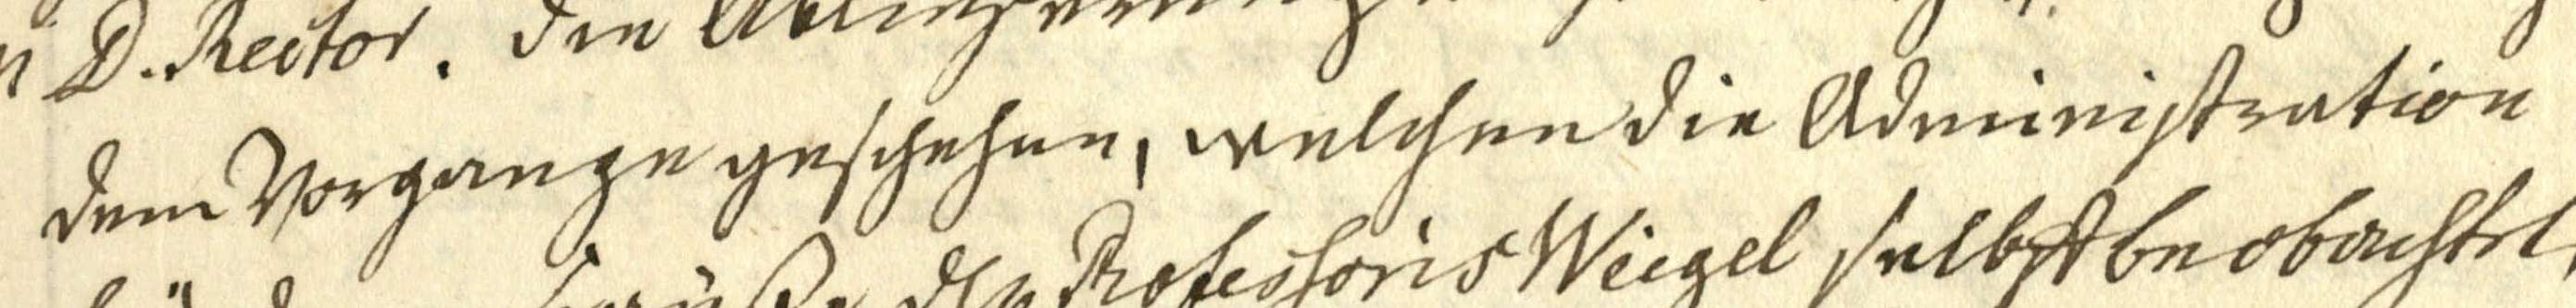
dem Vorgange geschehen, welchen die Administration
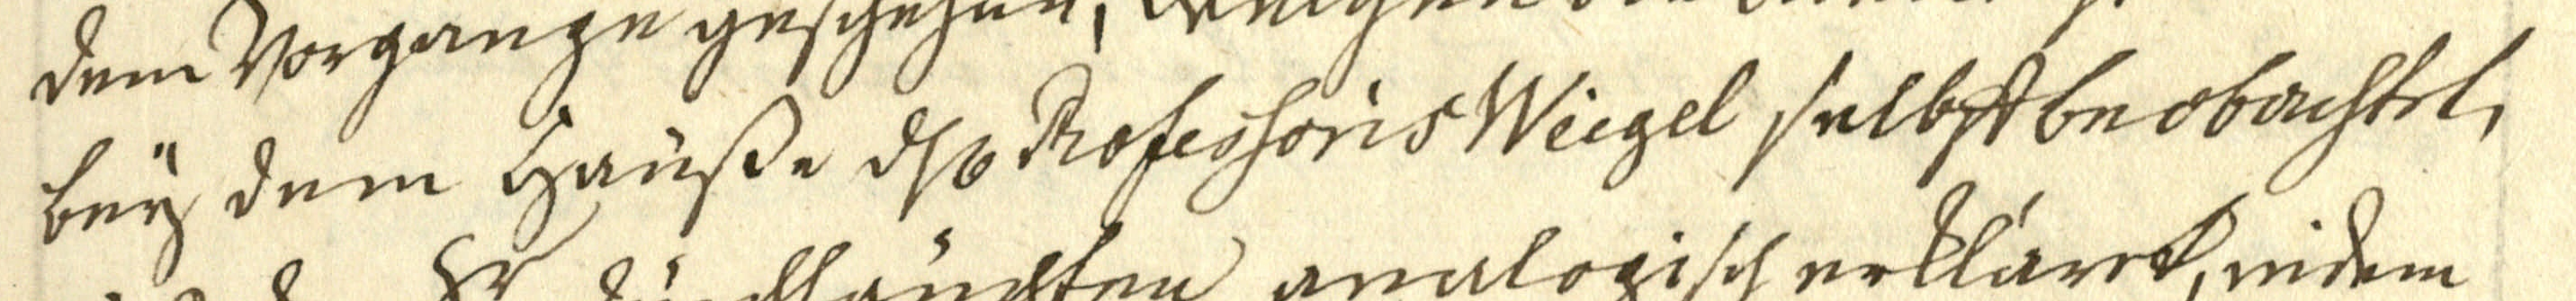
beÿ dem Hauße dh Professoris Weigel selbst beobachtet,
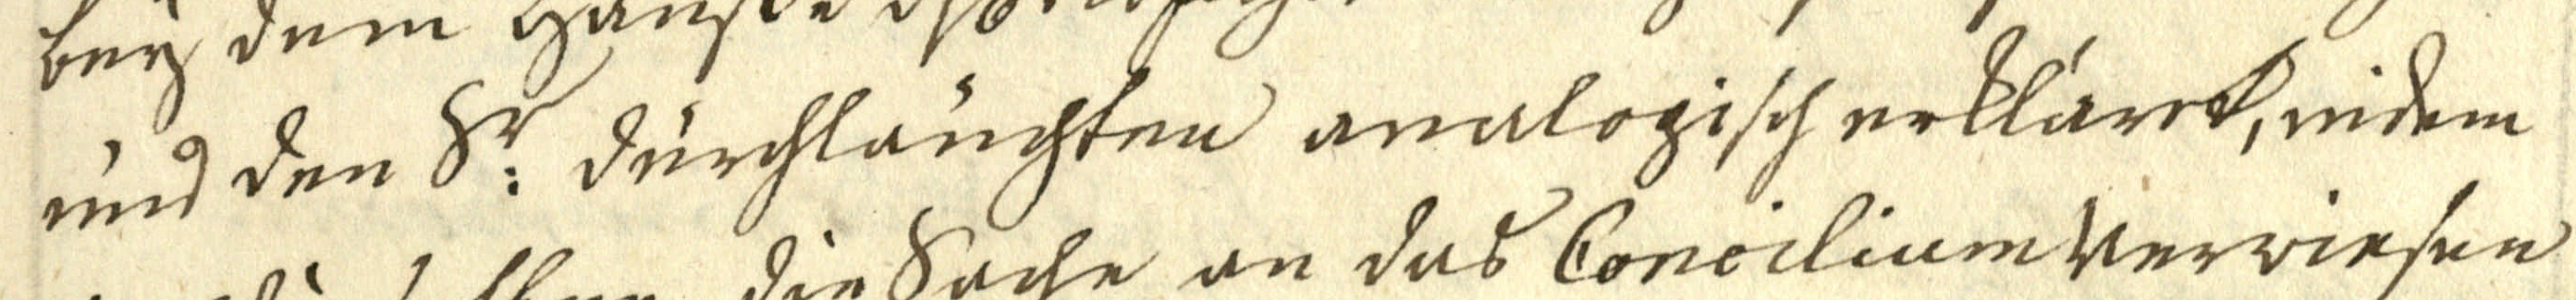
und den Sr. Durchlauchten analogisch erkläret, indem
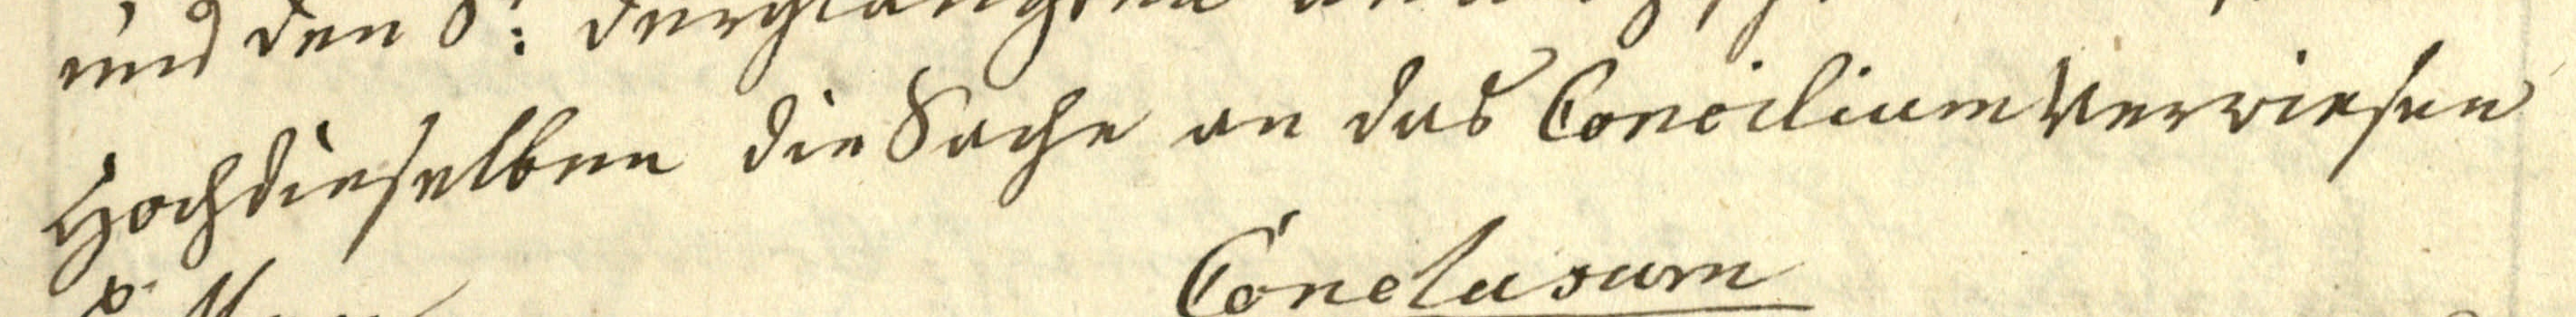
Hochdieselben die Sache an das Concilium verwiesen
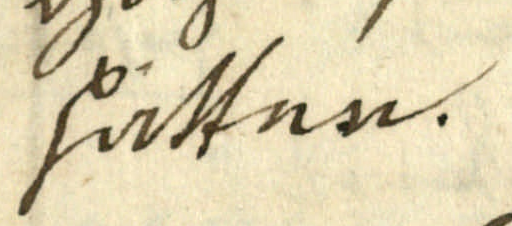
hätten.
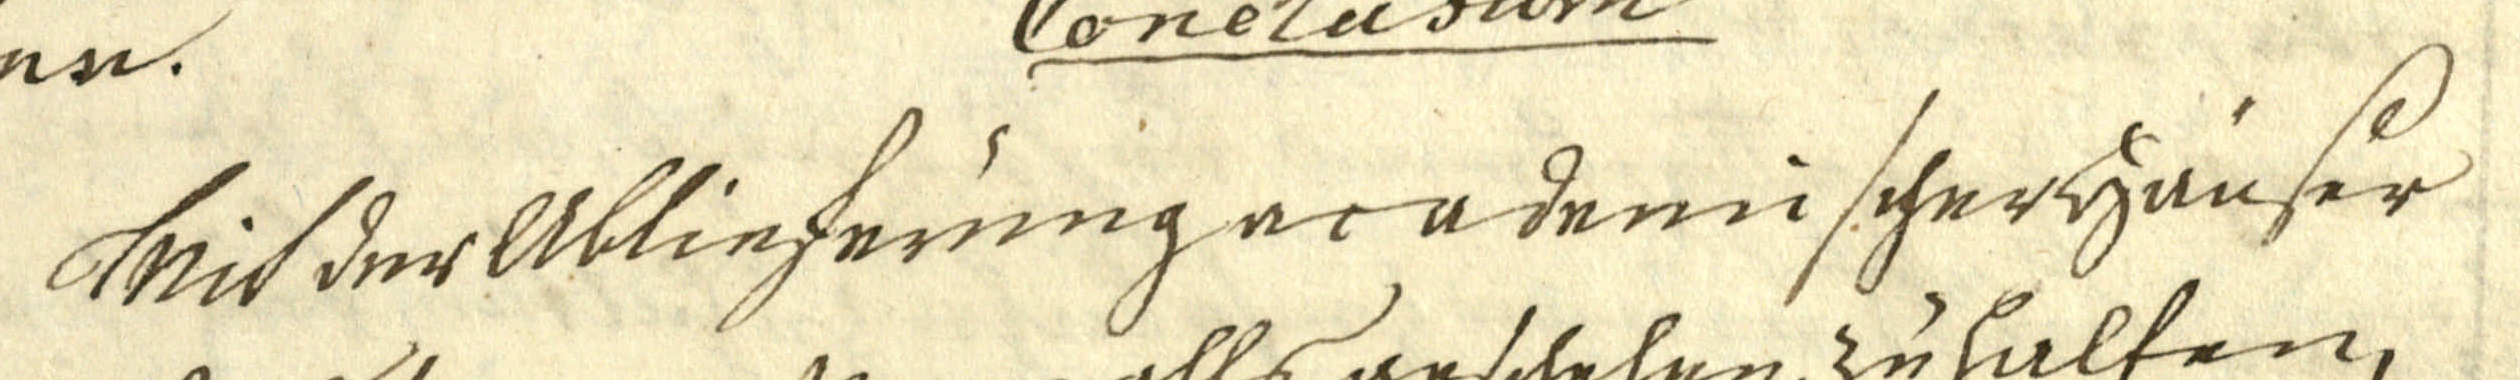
Mit der Ablieferung academischer Häußer
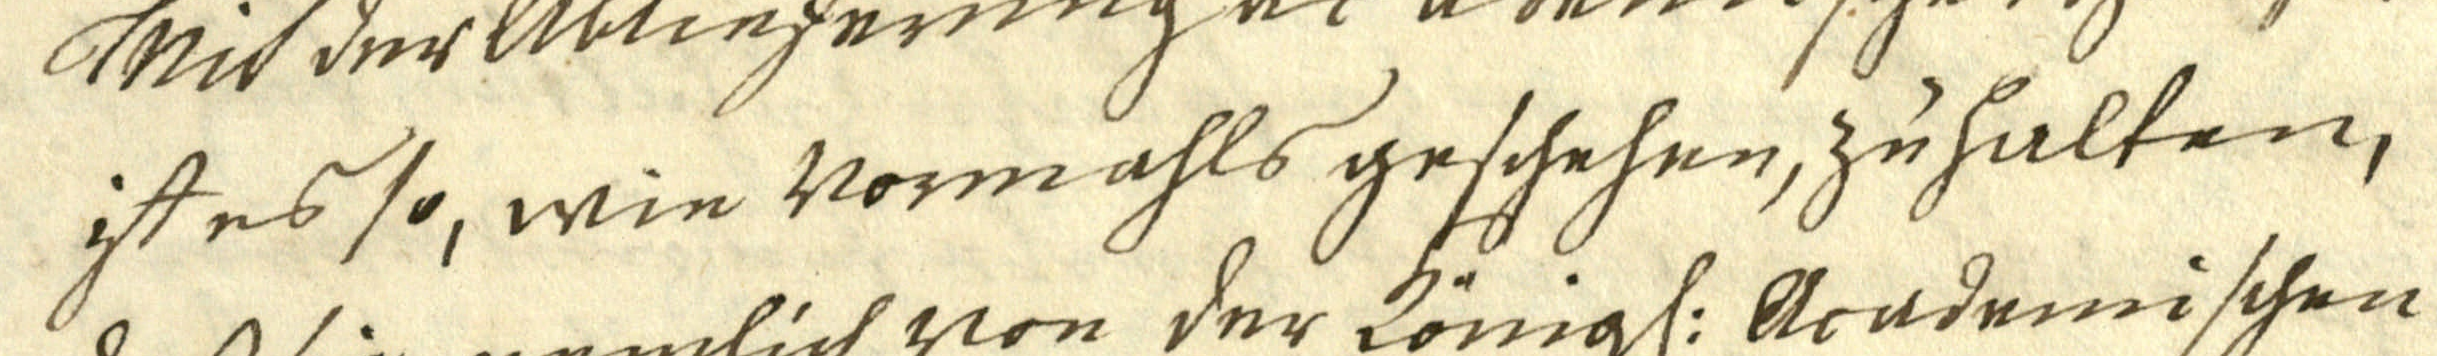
ist es so, wie vormahls geschehen, zu halten,
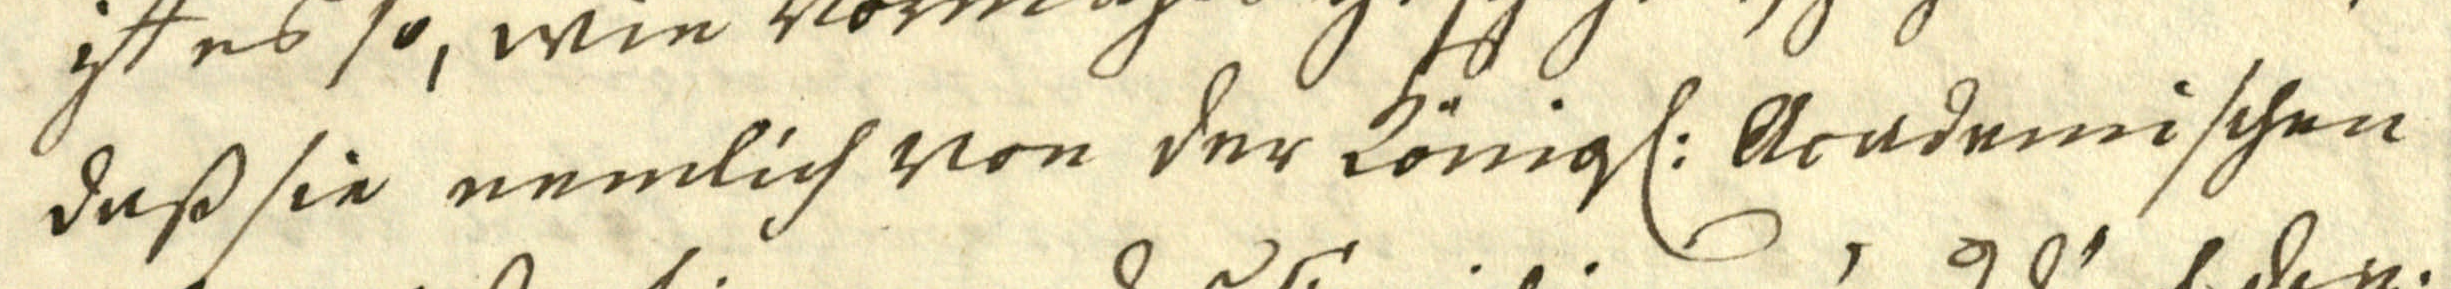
daß sie nemlich von der Königl. Academischen
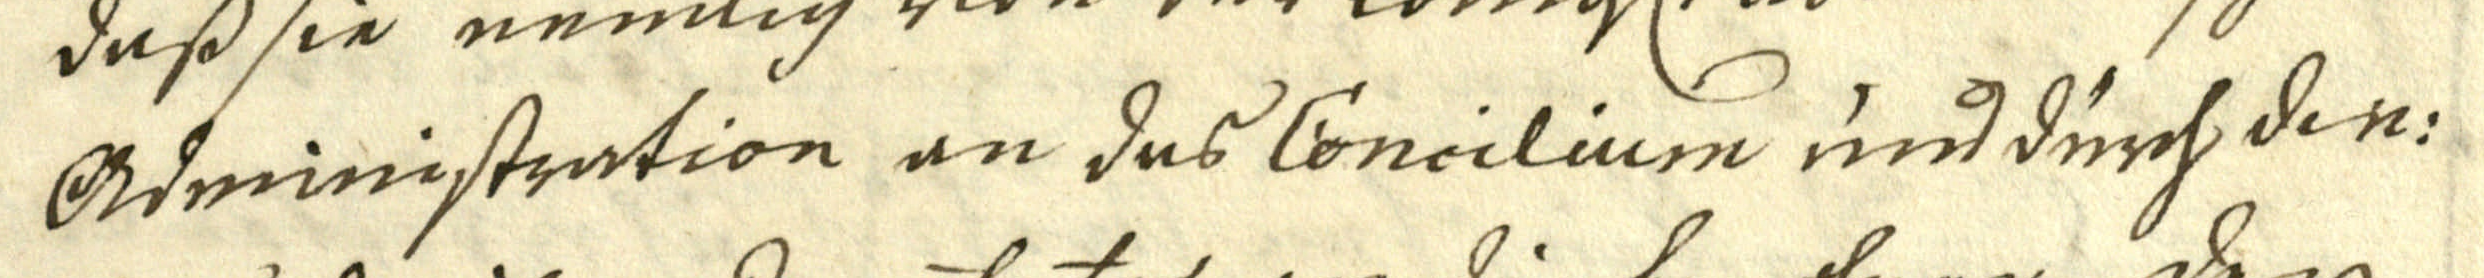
Administration an das Concilium und durch die¬
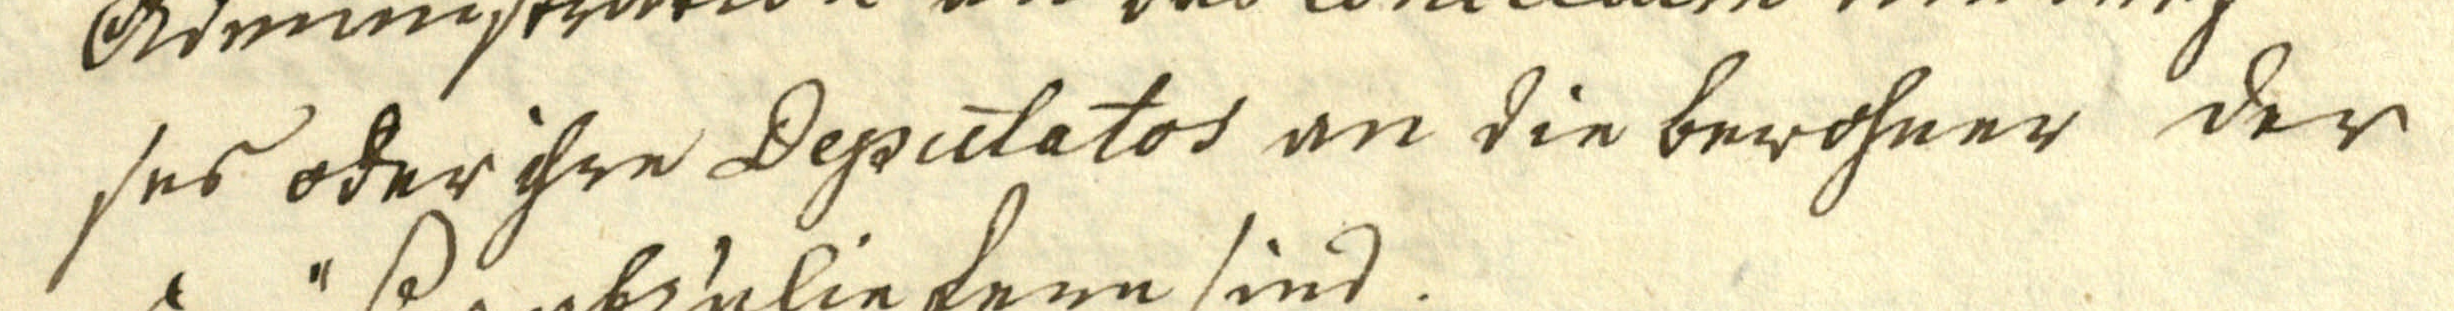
ses oder ihre Deputatos an die Bewohner der
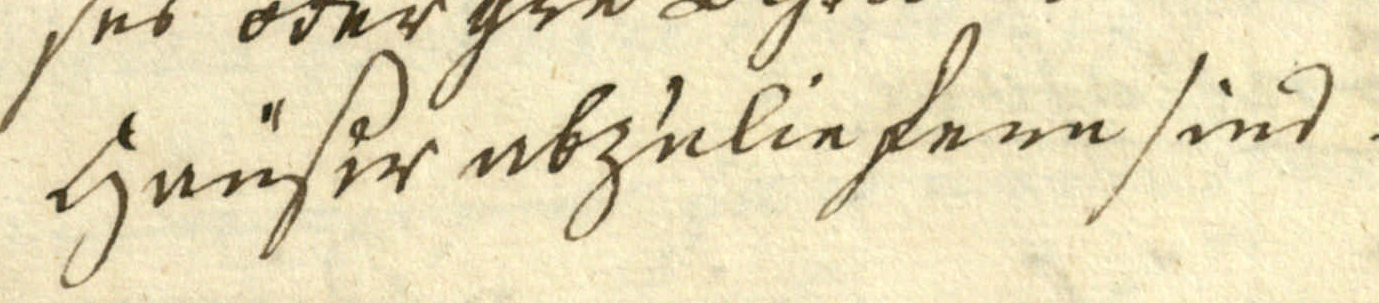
Häußer abzuliefern sind.
